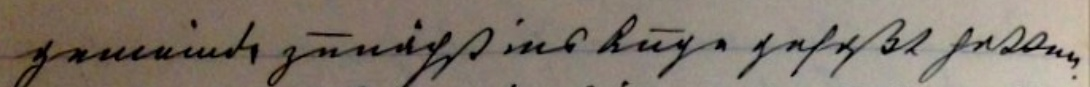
gemeinde zunächst ins Auge gefasst hatten.
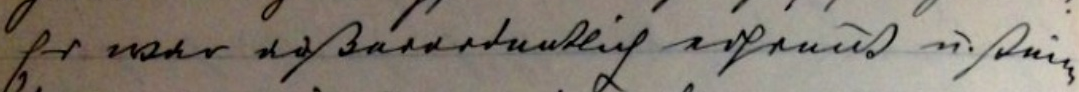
Er war außerordentlich erfreut u. stimm
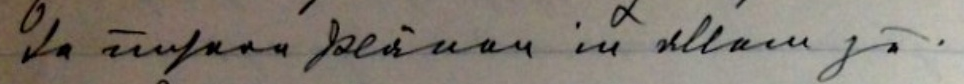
te unseren Plänen in allem zu.
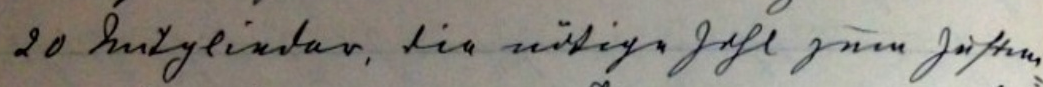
20 Mitglieder, die nötige Zahl zum Zusam
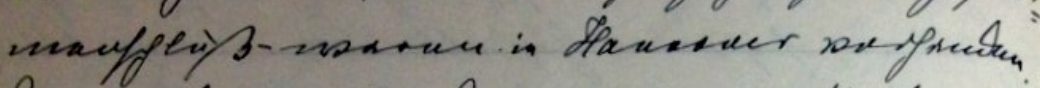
menschluß waren in Hannover vorhanden.
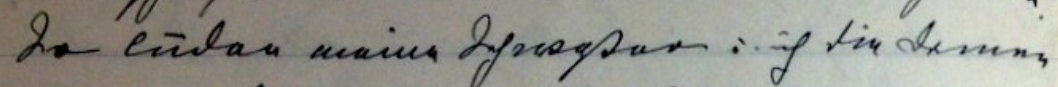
So luden meine Schwester u. ich die Damen
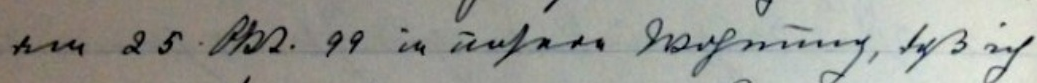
am 25. Okt. 99 in unsere Wohnung, daß ich
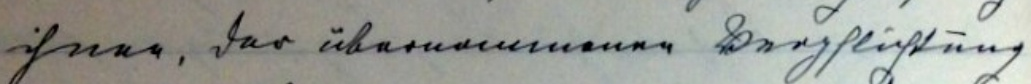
ich ihnen, der übernommenen Verpflichtung
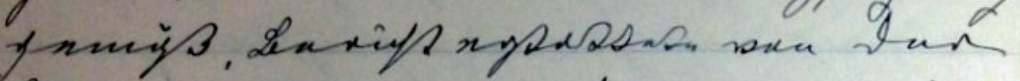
gemäß, Bericht erstattet von der
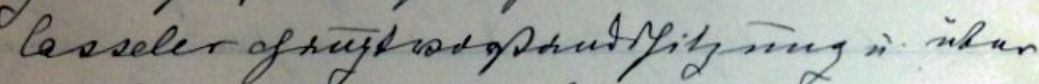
Casseler Hauptvorstandssitzung u. über
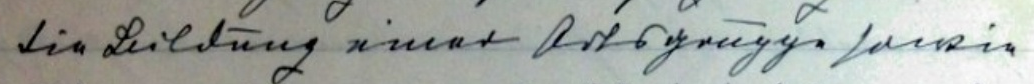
die Bildung einer Ortsgruppe, sowie
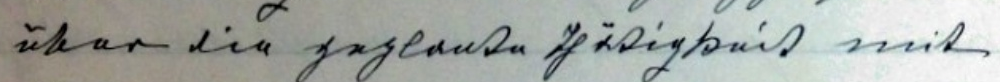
über die geplante Thätigkeit mit
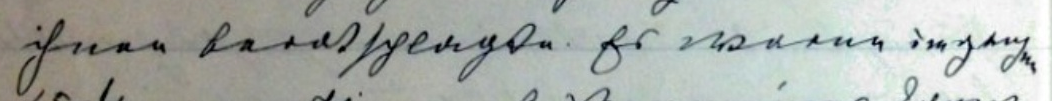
ihnen beratschlagte. Es waren im ganzen
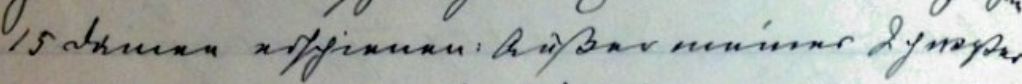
15 Damen erschienen. Außer meiner Schwester
